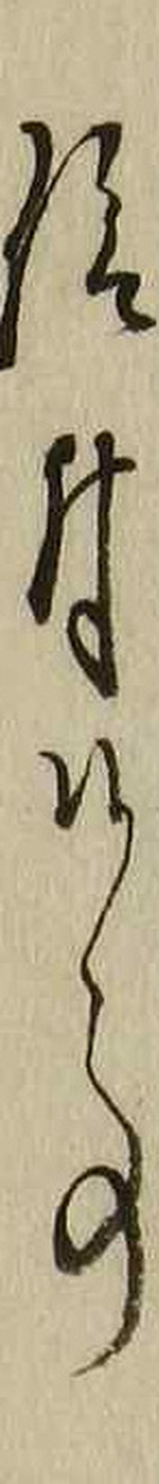仰付候事
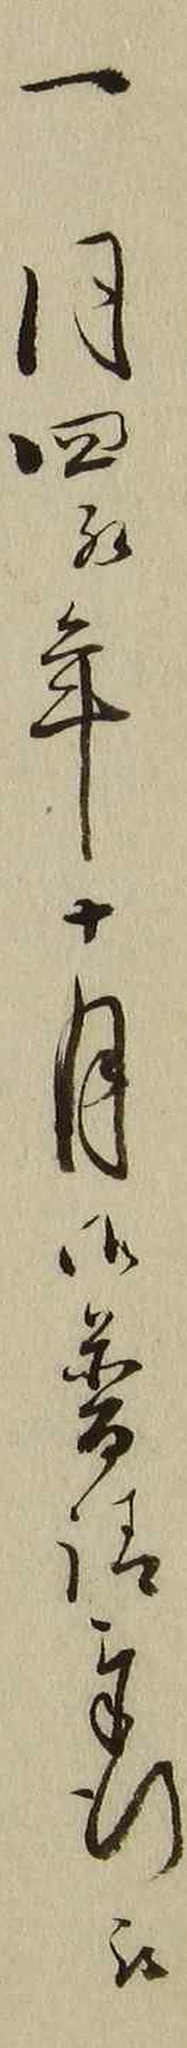一同四卯年十月御普請奉行被
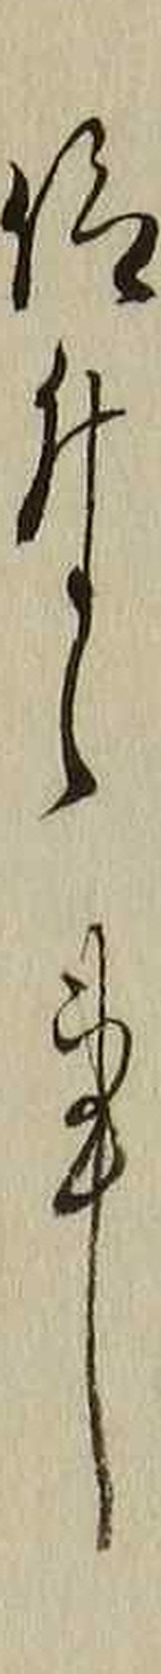仰付候事
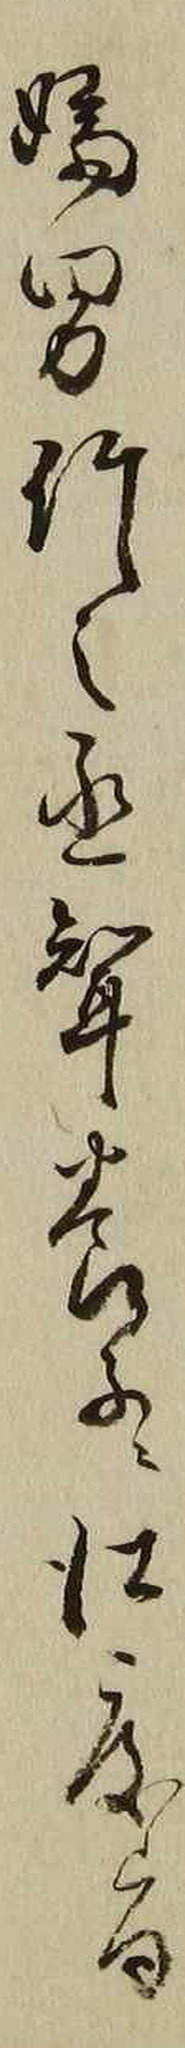嫡男竹之丞聟養子ニ支度旨
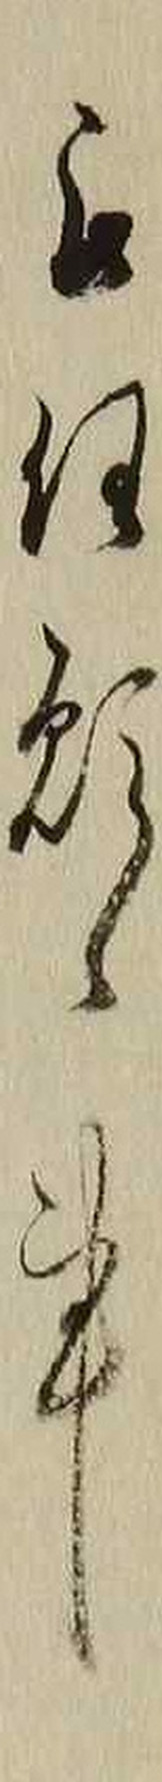被任願候事
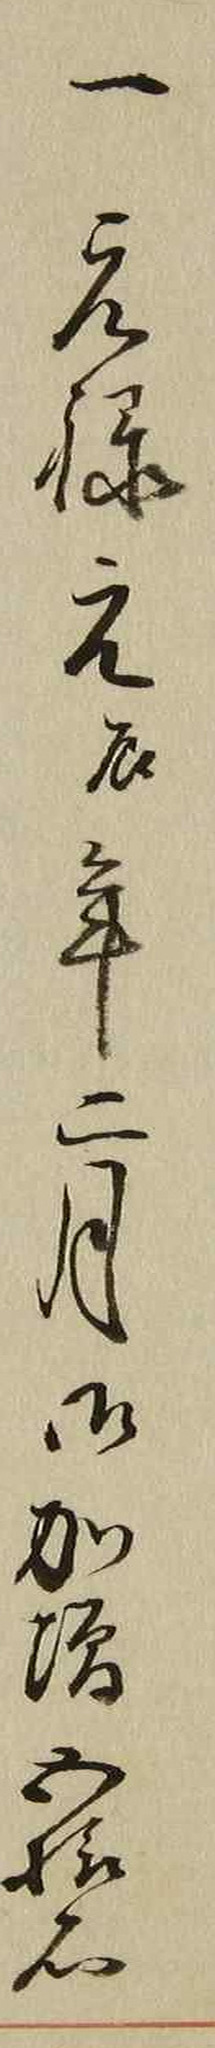一元禄辰年二月御加増五拾石
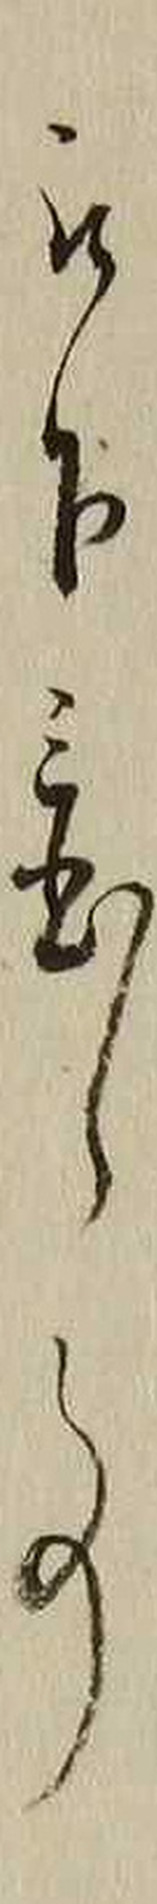被下置候事
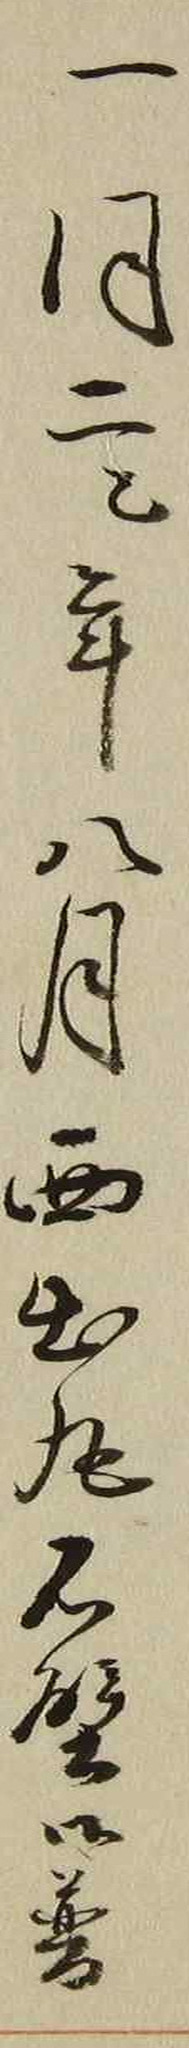一同二巳年八月西出丸石壁御普
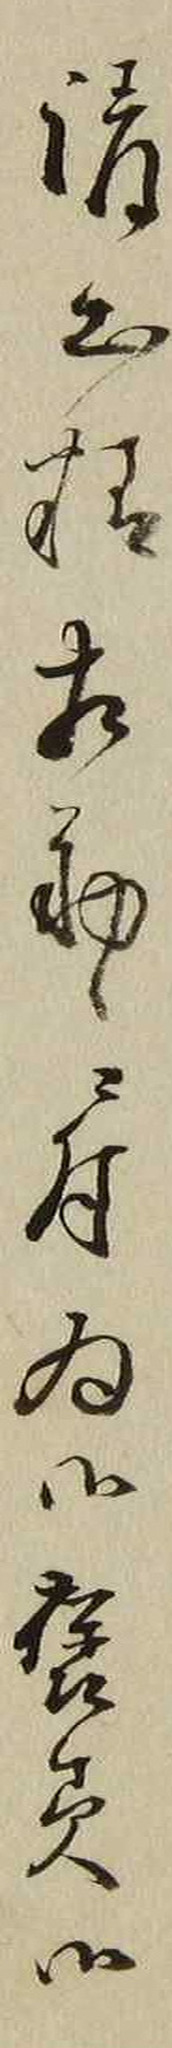請出精相勤候ニ付為御褒美御
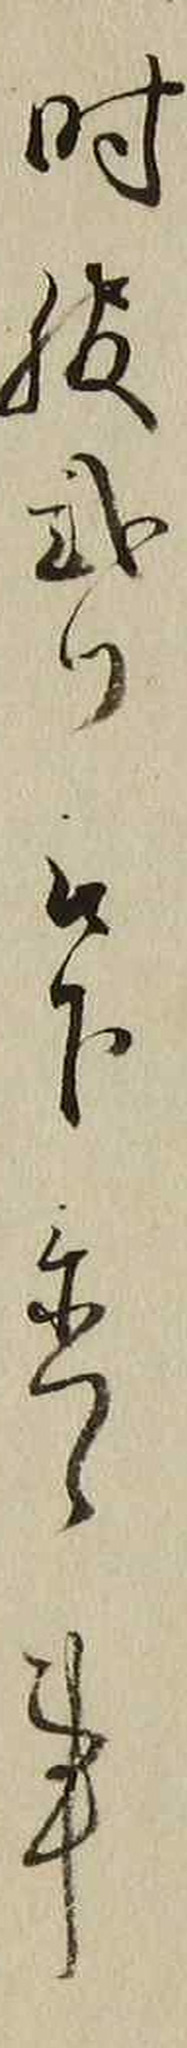時服弐ツ被下置候事
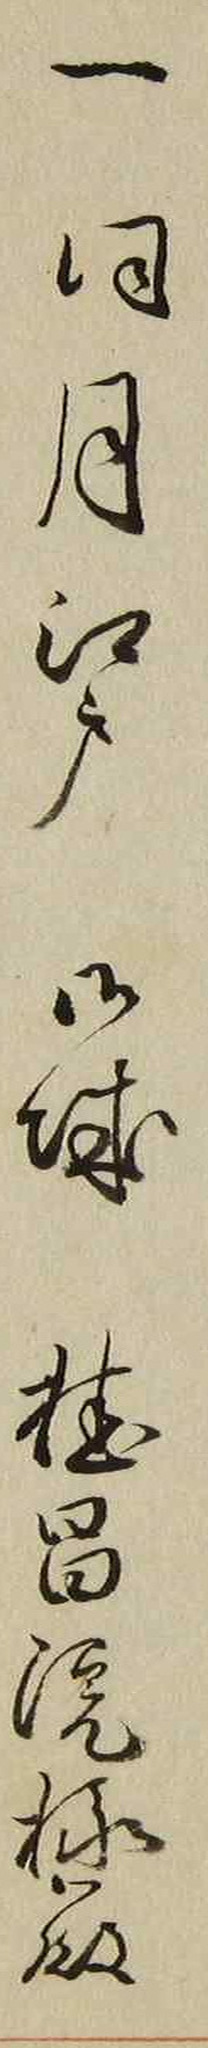一同月江戸御城桂昌院様御殿
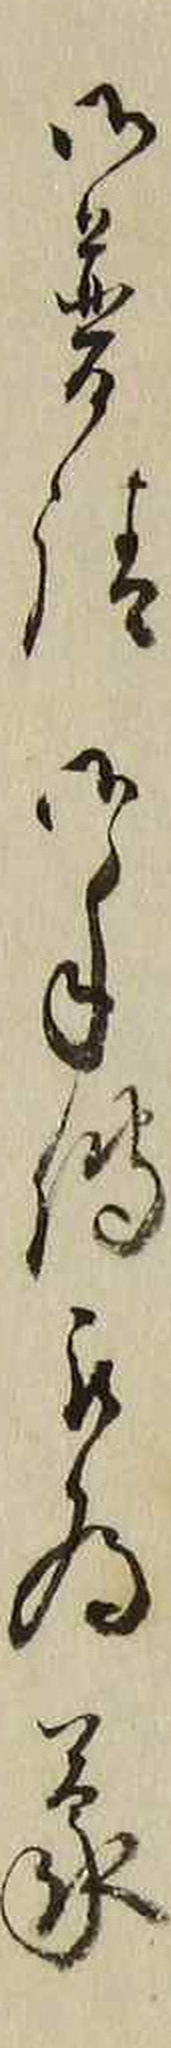御普請御手伝被為蒙
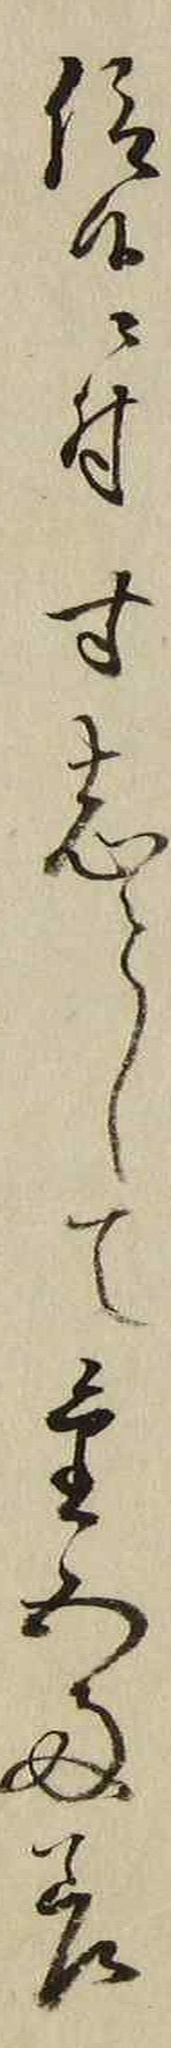仰付候ニ付寸志として金五両差
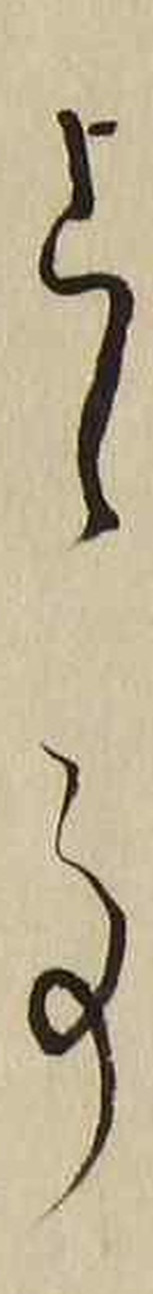上候事

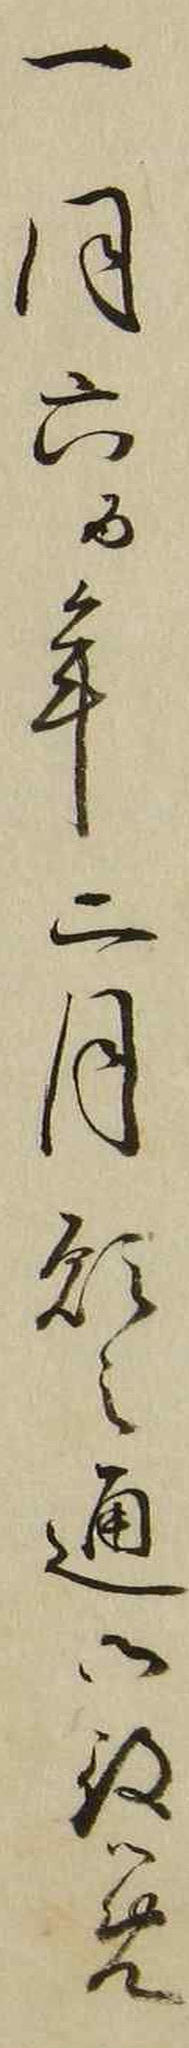一同六酉年二月願之通御役御免
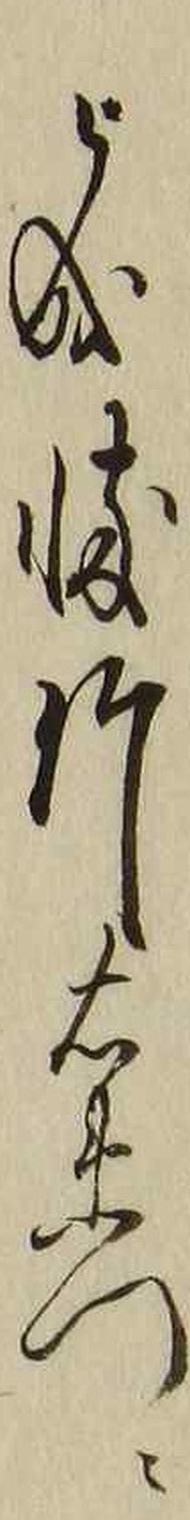被成悴竹右衛門ニ
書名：諸士系譜　巻之1　い之部1
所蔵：会津若松市立会津図書館
